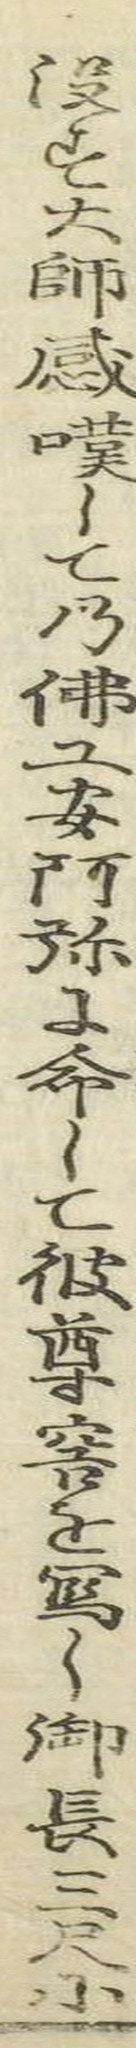没す大師感嘆して乃仏工安阿弥に命して彼尊容を写し御長三尺に
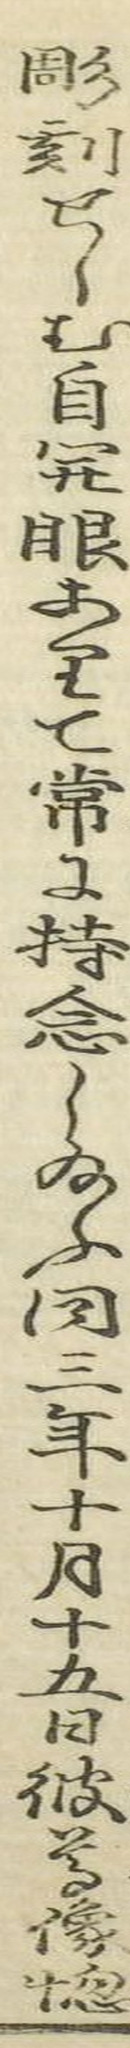彫刻せしむ自開眼ありて常に持念し給ふ同三年十月十五日彼尊像惚
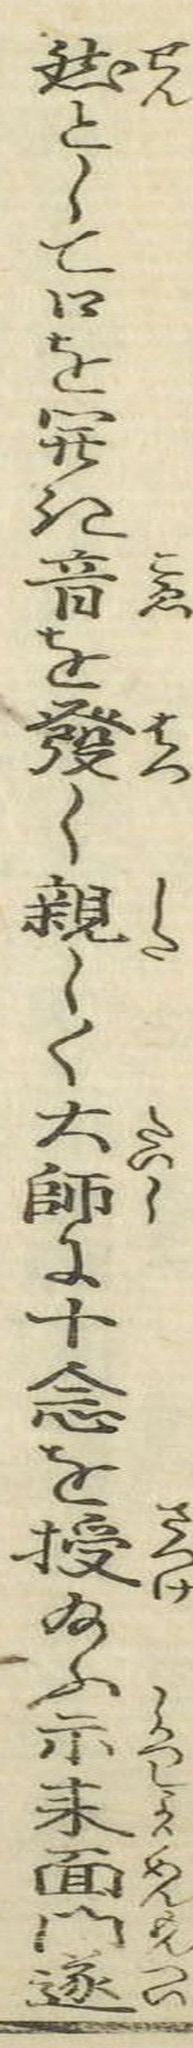然として口を開き音を発し親しく大師に十念を授給ふ尓来面門遂
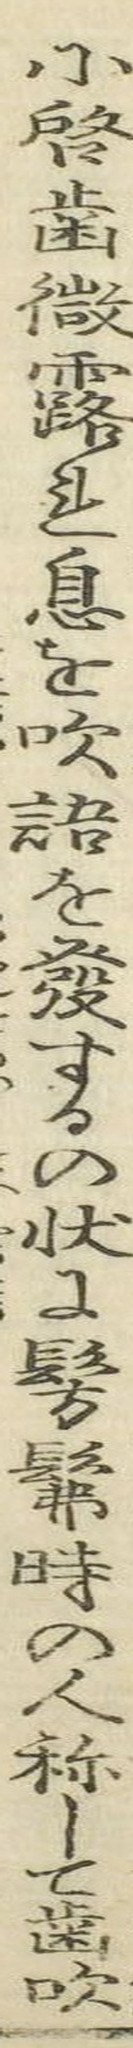に啓歯微露れ息を吹語を発するの状に髣髴時の人称して歯吹
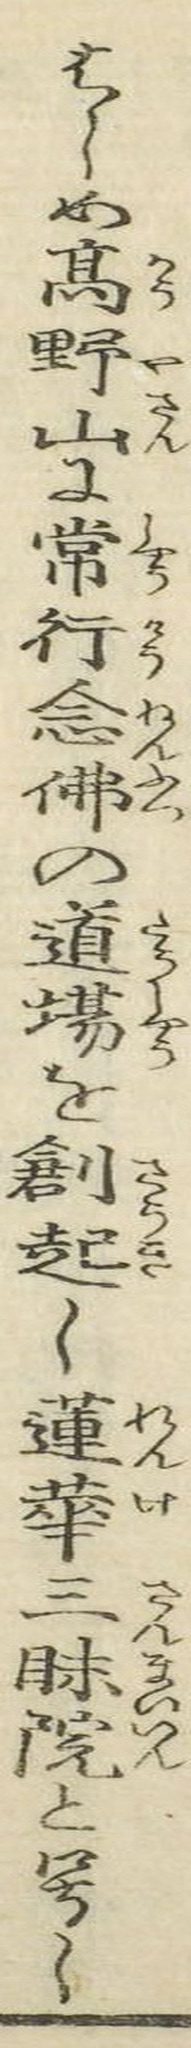はしめ高野山に常行念仏の道場を創起し蓮華三昧院と号し
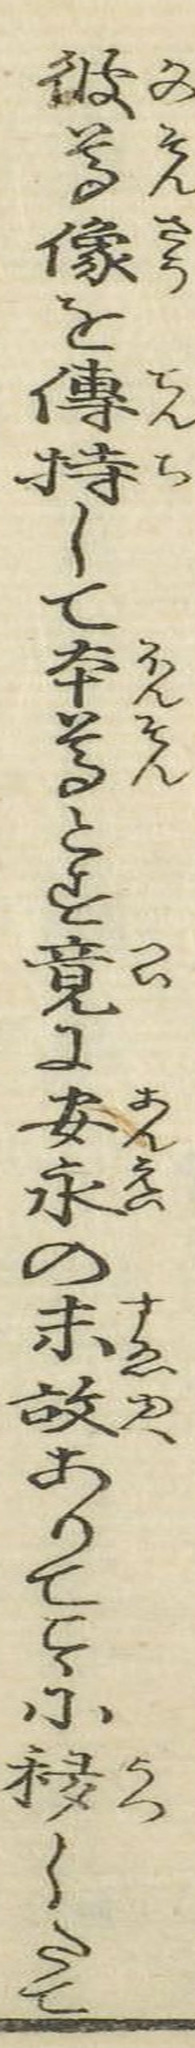彼尊像を伝持して本尊とす竟に安永の末故ありてこゝに移したて
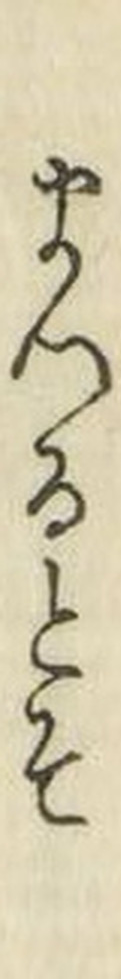まつるとそ
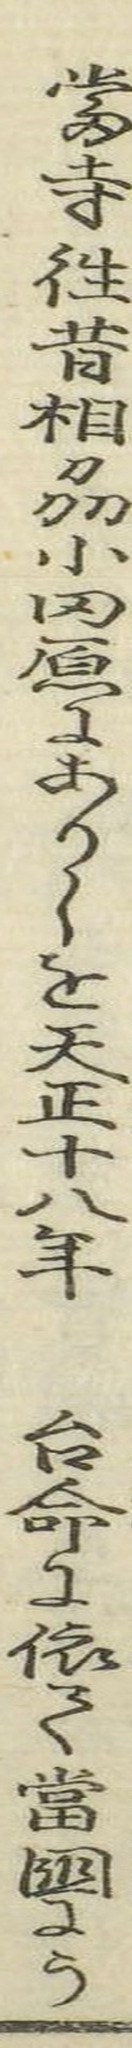当寺往昔相州小田原にありしを天正十八年台命に依て当国にう
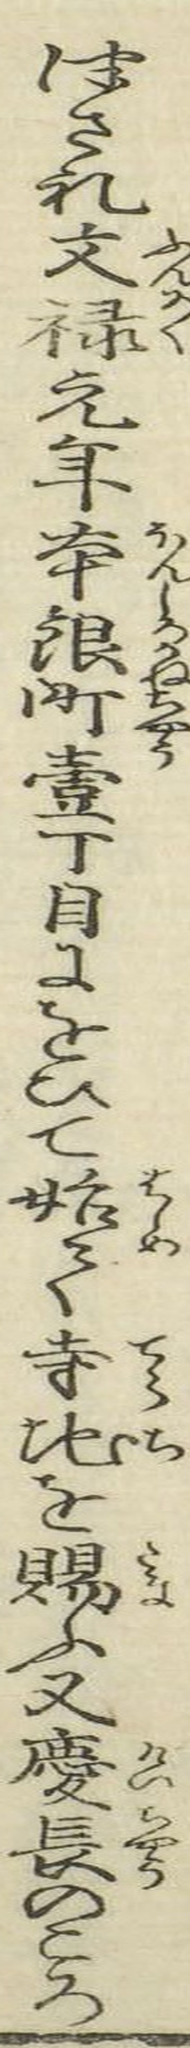つされ文禄元年本銀町壱丁目にをひて始て寺地を賜ふ又慶長のころ
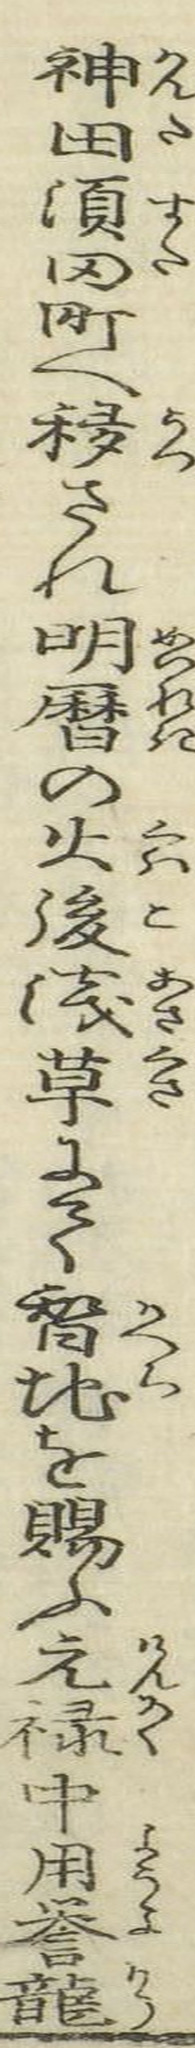神田須田町へ移され明暦の火後浅草にて替地を賜ふ元禄中用誉龍
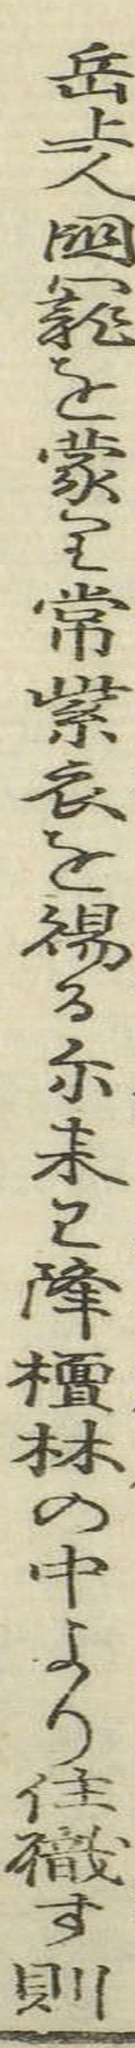岳上人国寵を蒙り常紫衣を賜る尓来已降檀林の中より住職す則
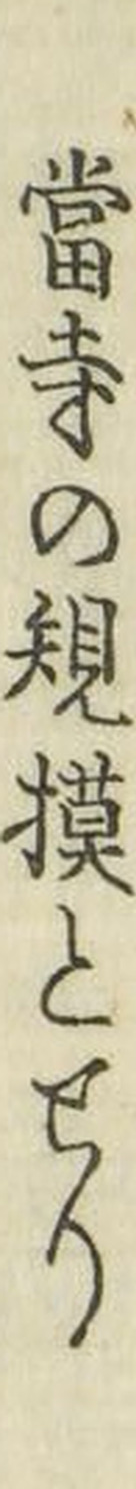当寺の規摸とせり
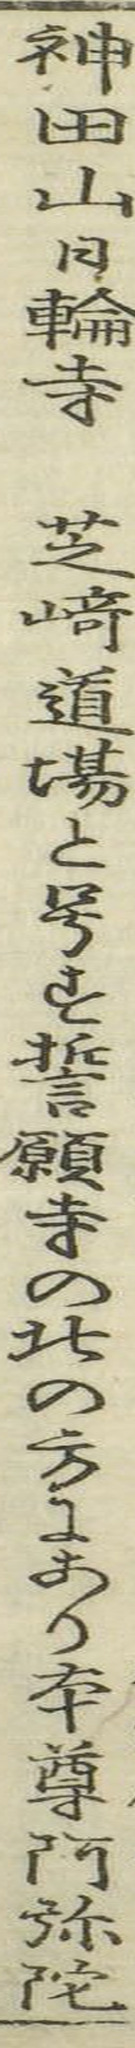神田山日輪寺芝崎道場と号す誓願寺の北の方にあり本尊阿弥陀
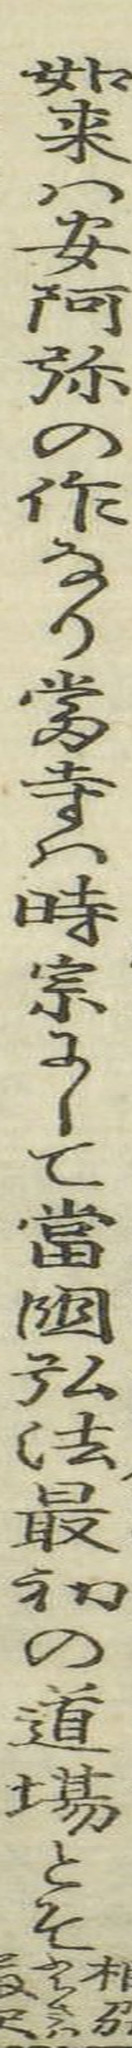如来は安阿弥の作なり当寺は時宗にして当国弘法最初の道場とそ相州藤沢

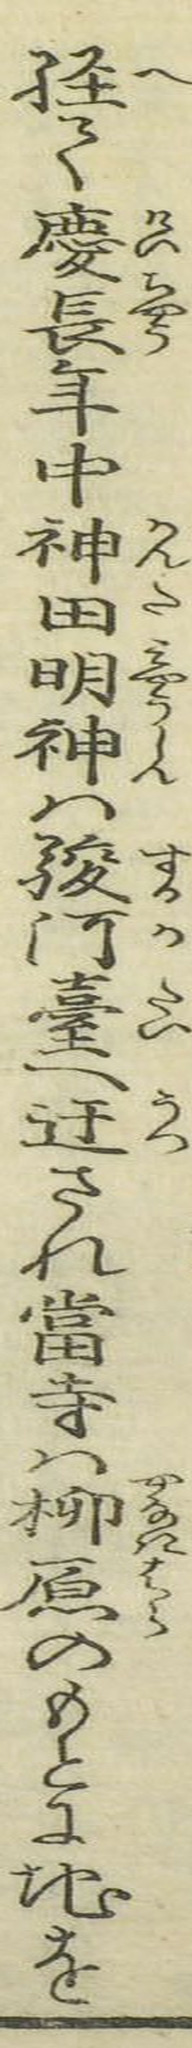経て慶長年中神田明神は駿河台へ遷され当寺は柳原のもとに地を
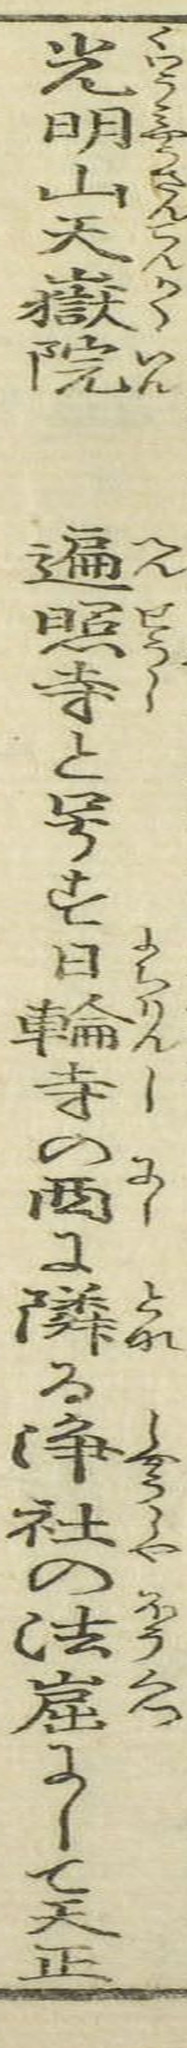光明山天嶽院遍照寺と号す日輪寺の西に隣る浄社の法崫にして天正
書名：江戸名所図会 20巻 巻之16
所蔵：東京学芸大学教育コンテンツアーカイブ
